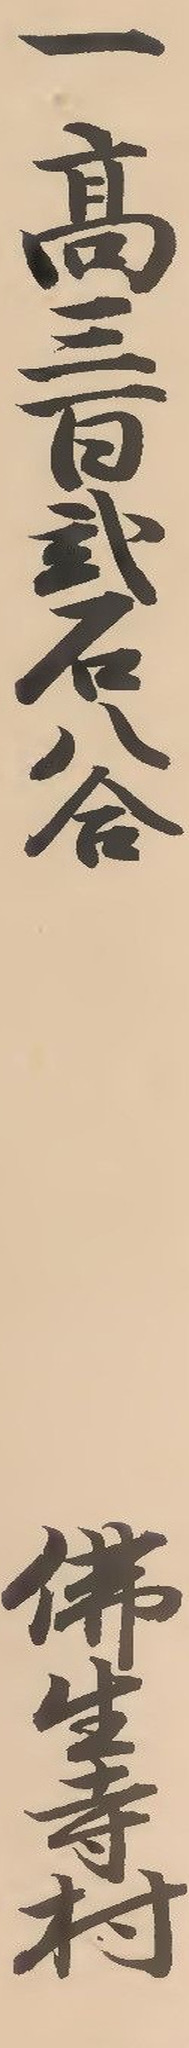一高三百弐石八合仏生寺村
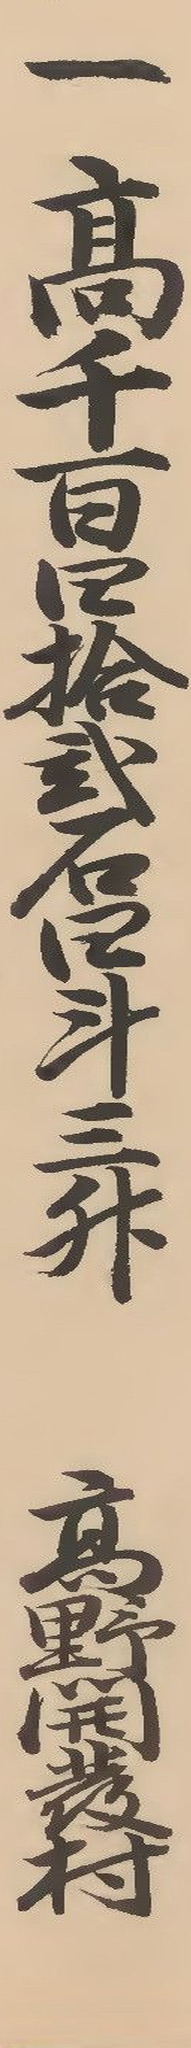一高千百四拾弐石四斗三升高野開発村

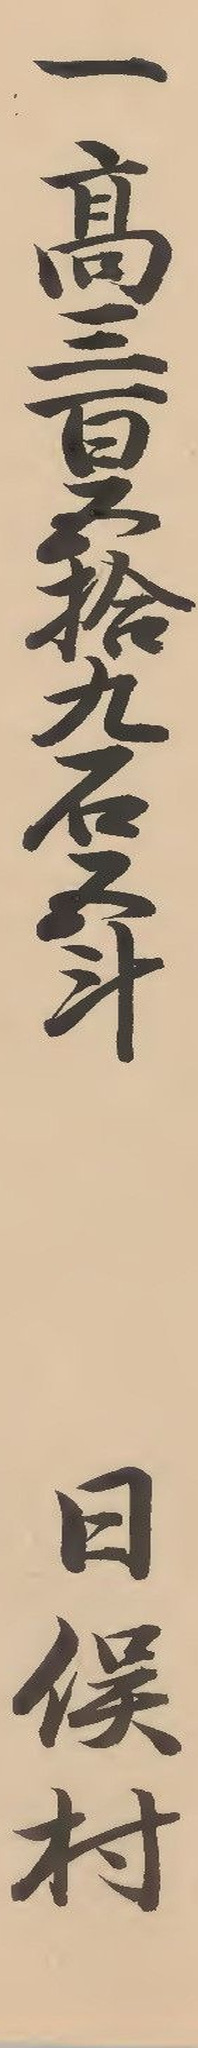一高三百五拾九石五斗日俣村
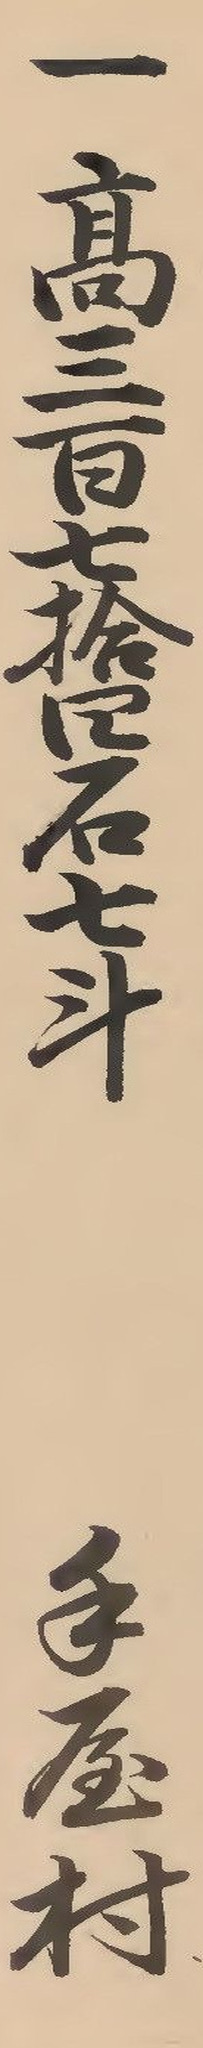一高三百七拾四石七斗手屋村
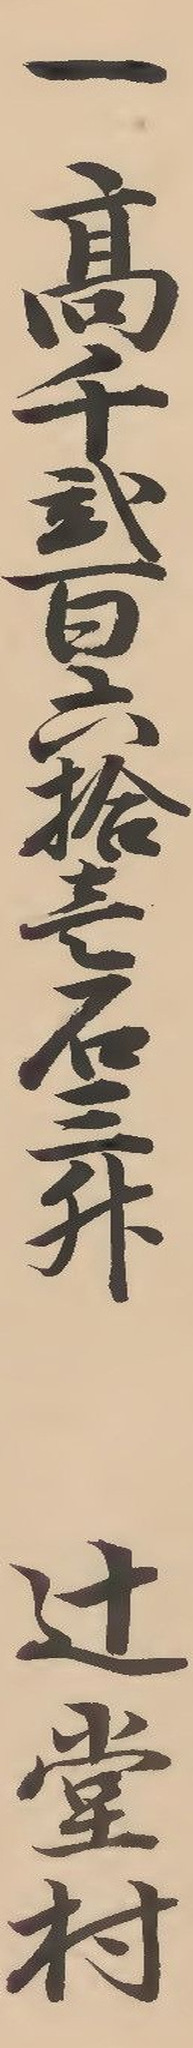一高千弐百六拾壱石三升辻堂村
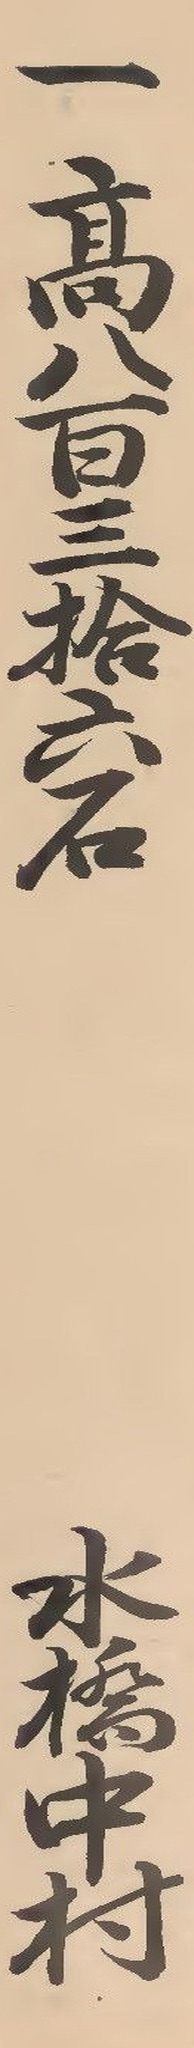一高八百三拾六石水橋中村
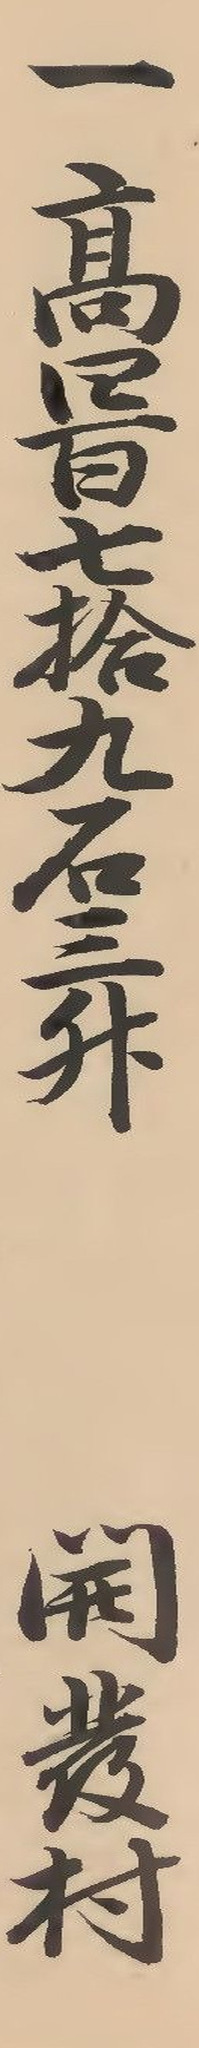一高四百七拾九石三升開発村

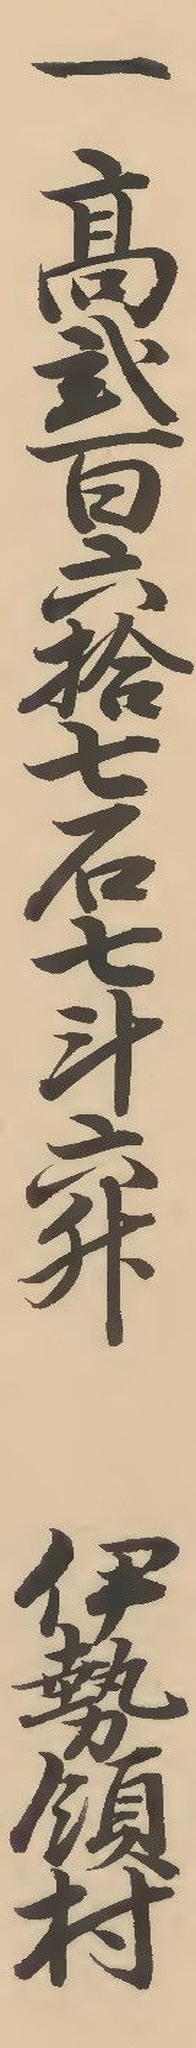一高弐百六拾七石七斗六升伊勢領村
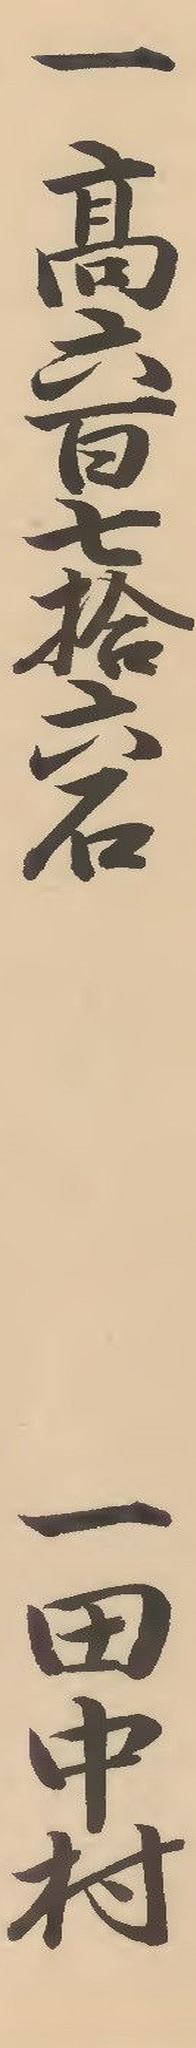一高六百七拾六石一田中村
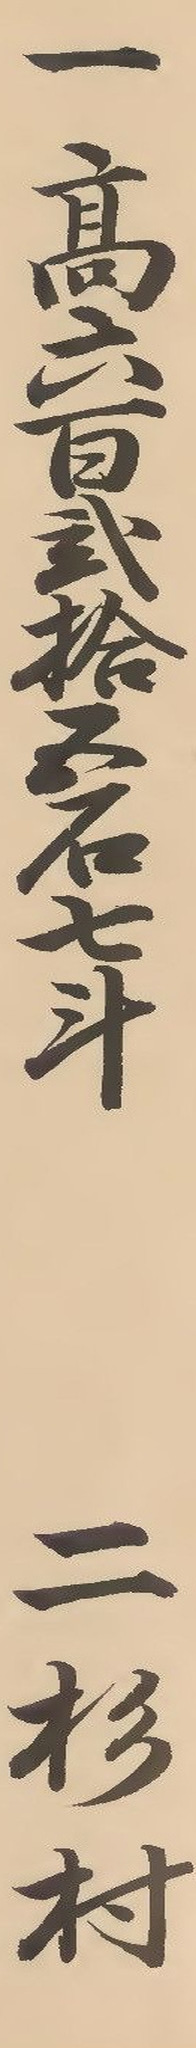一高六百弐拾五石七斗二杉村
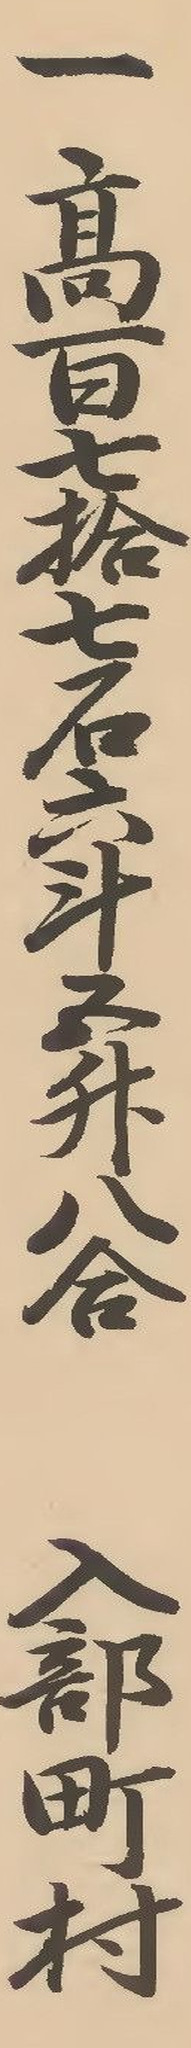一高百七拾七石六斗五升八合入部町村
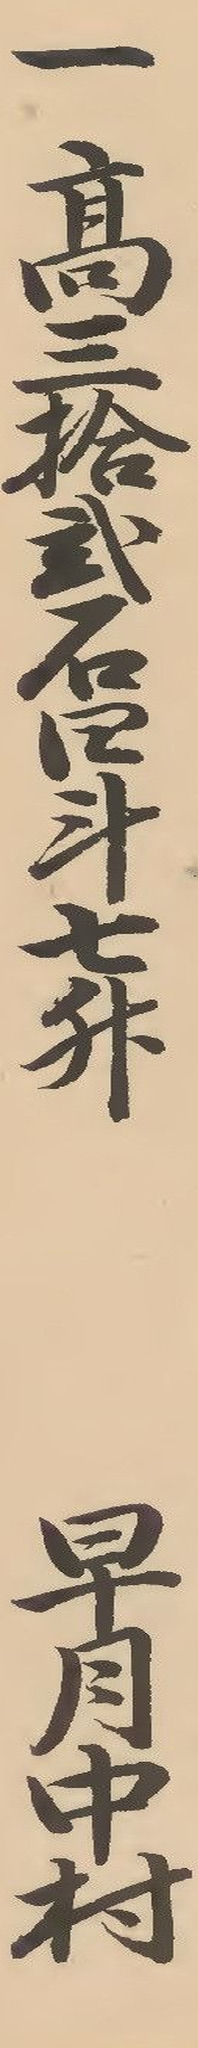一高三拾弐石四斗七升早月中村

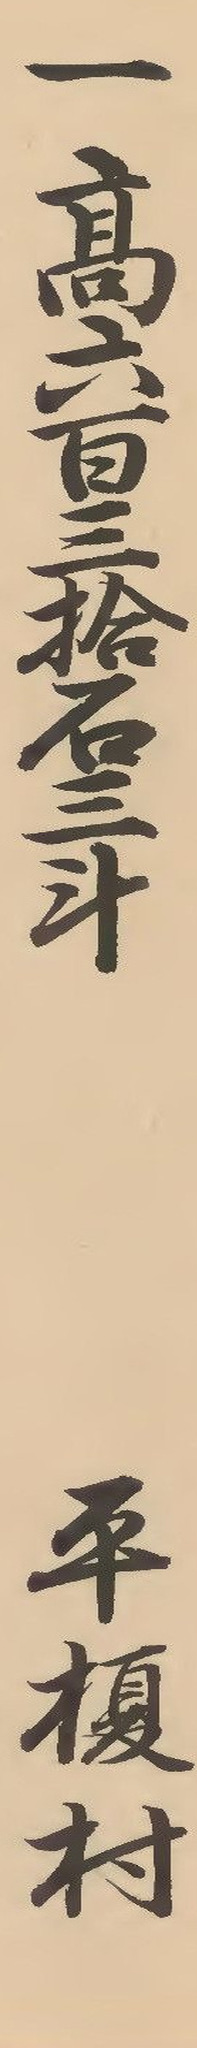一高六百三拾石三斗平榎村
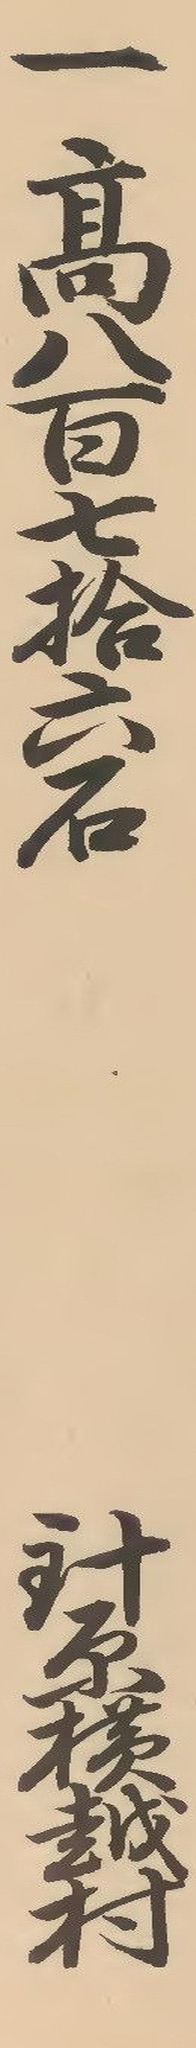一高八百七拾六石針原横越村
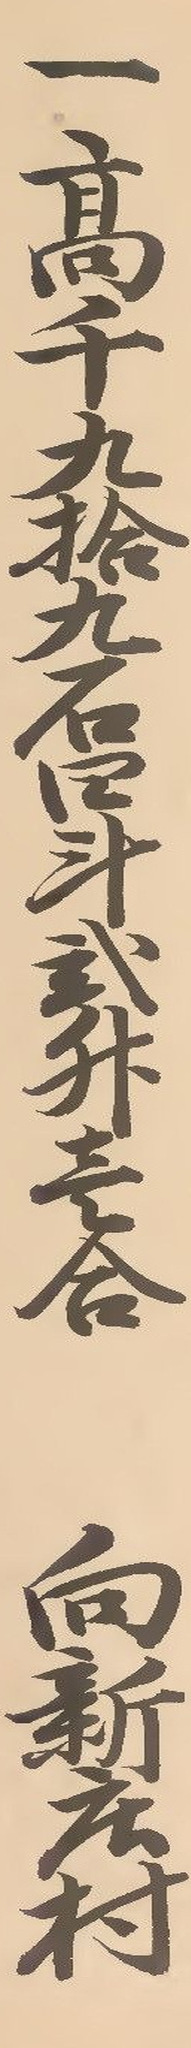一高千九拾九石四斗弐升壱合向新庄村
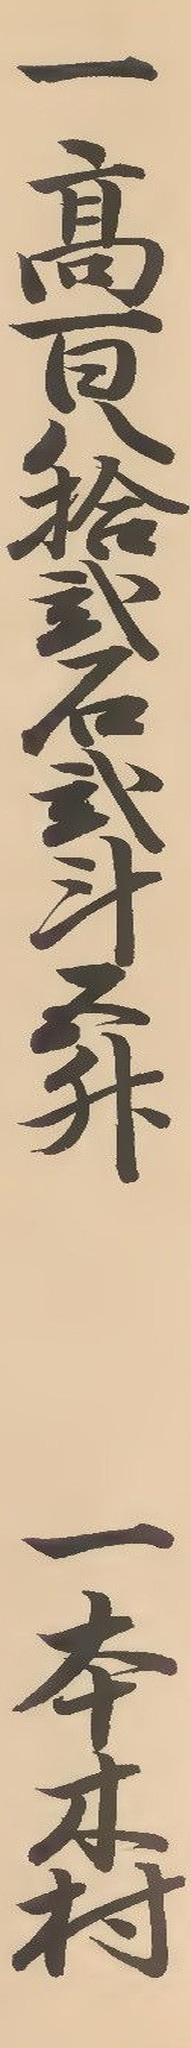一高百八拾弐石弐斗五升一本木村
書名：越中国郷帳
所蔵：国立公文書館 National Archives of Japan
